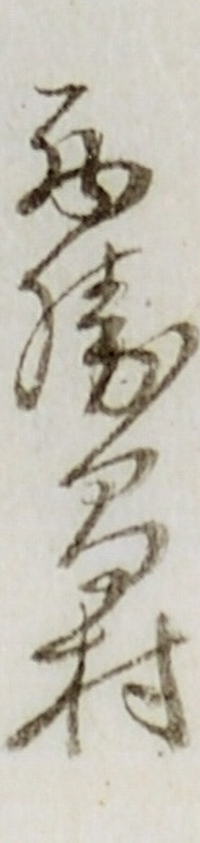西勝間村
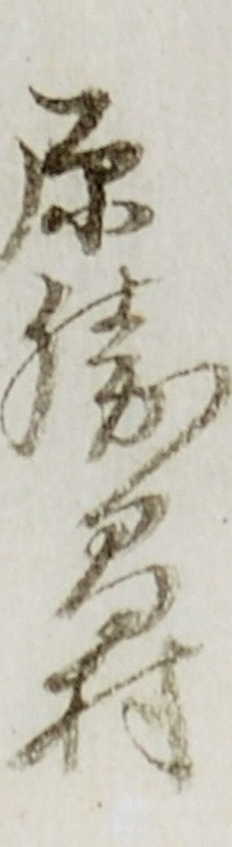西勝間村
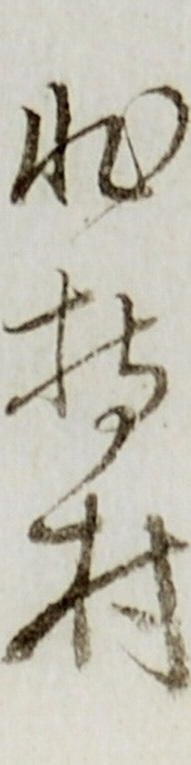鉾持村
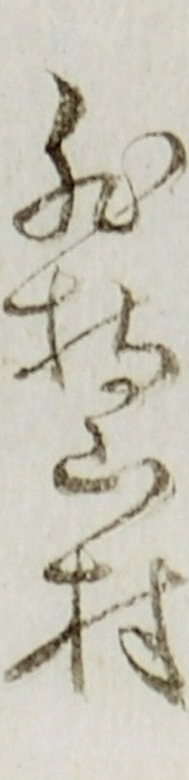非持山村
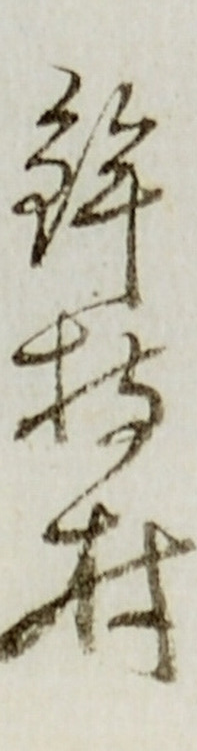鉾持村
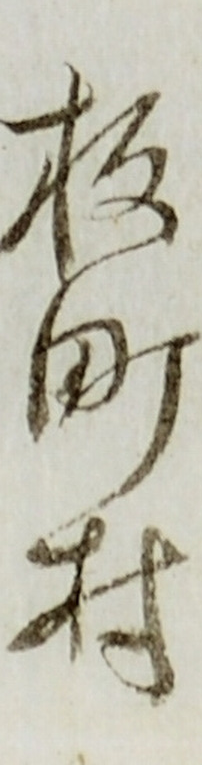板町村
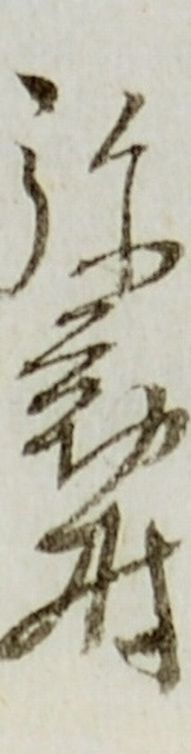弥勒村
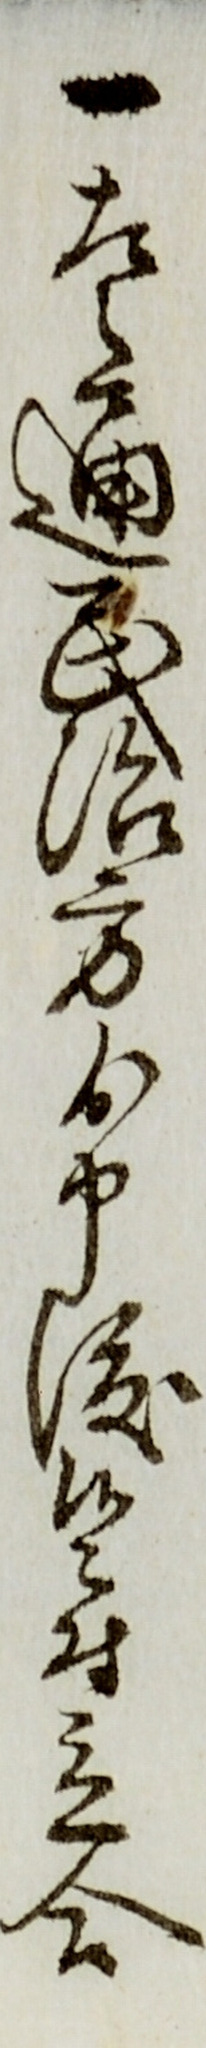一左之通民治方ゟ申渡候に付立合
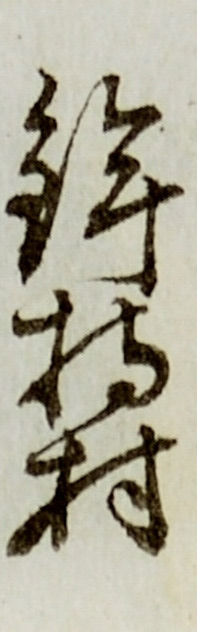鉾持村
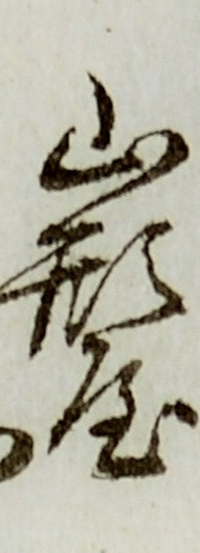山形屋
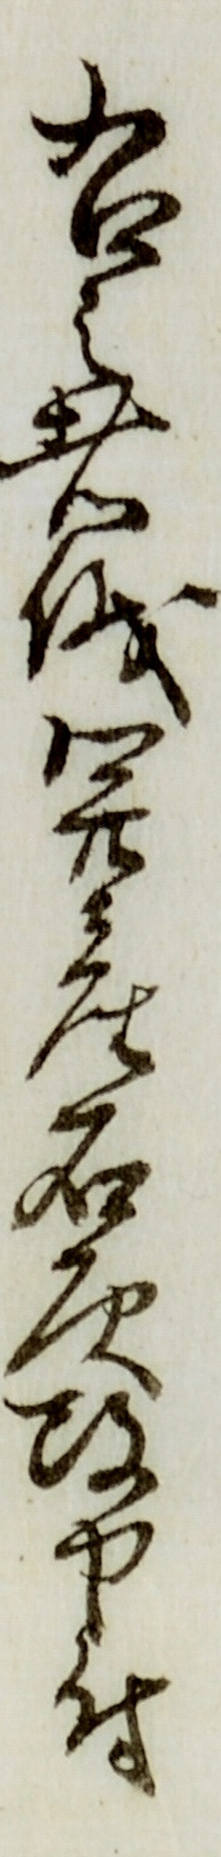右之者儀開産石灰改申付
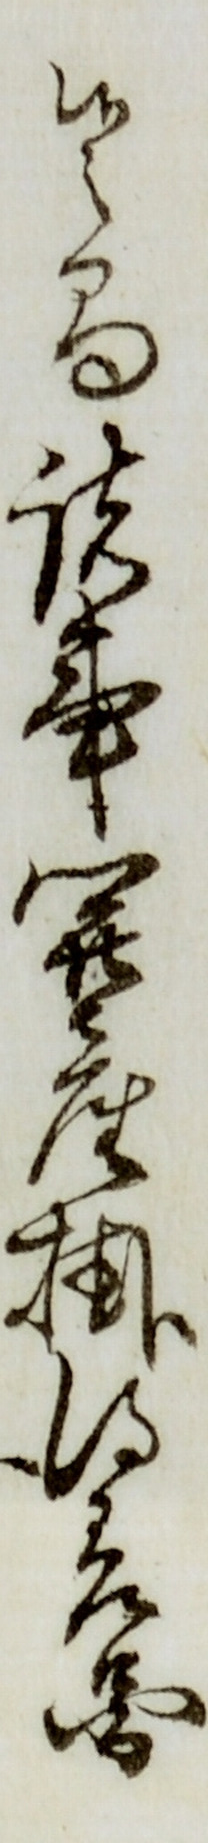候之間諸事開産掛得差図
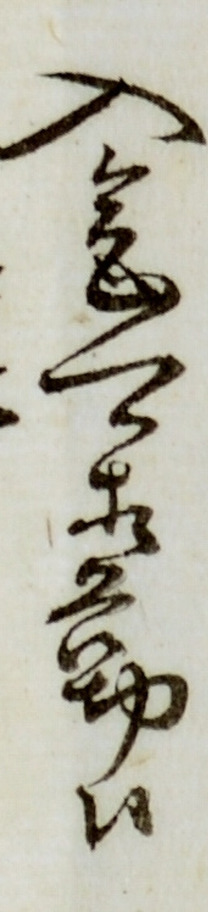入念可相勤候
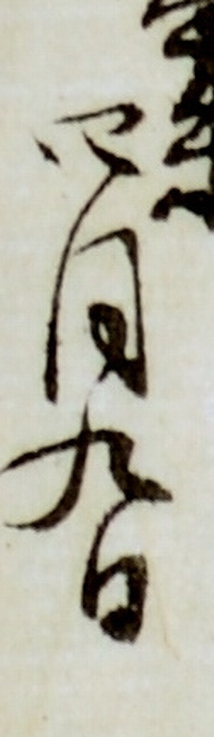四月九日

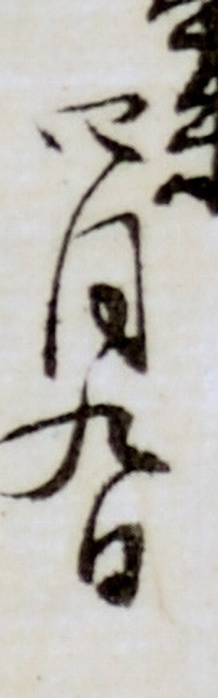四月九日
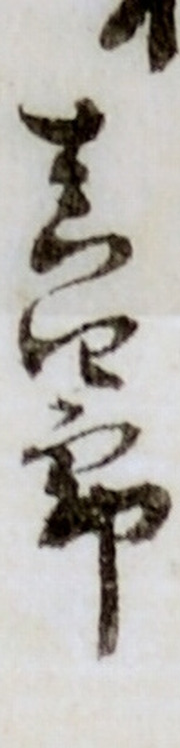真四郎
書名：山林方諸事御用留
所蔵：伊那市立高遠町図書館・合同会社AMANE
